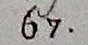67
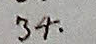34.
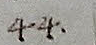44.
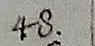48.
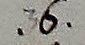36
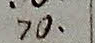70.
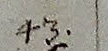43.
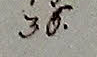36.
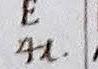41.
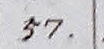57.
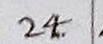24.
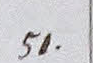51.
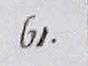61.
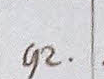92.
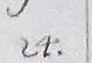24.
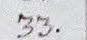33.
